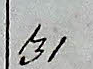31
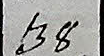38
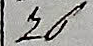26
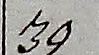39
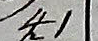41
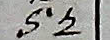52
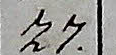27.
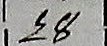28
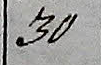30
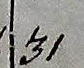31
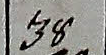38
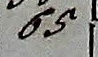65
